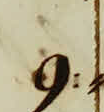9:
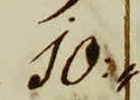10:
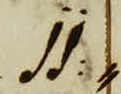11:
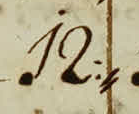12:
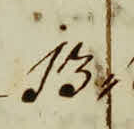13
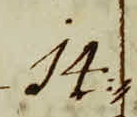14
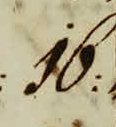16
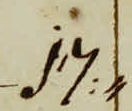17:
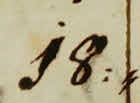18:
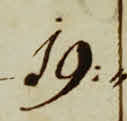19:
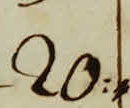20:
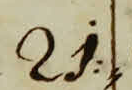21:
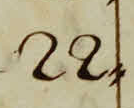22
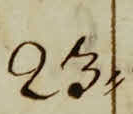23
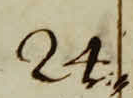24
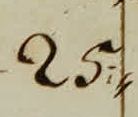25
